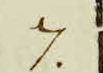7.
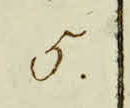5.
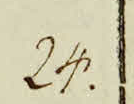24.
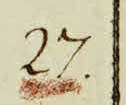27.
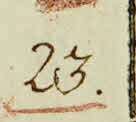23.
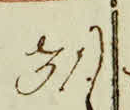31.
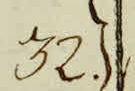32.
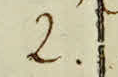2.
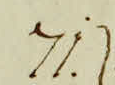71.
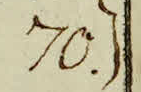70.
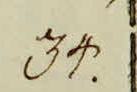34.
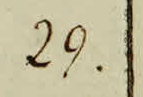29.
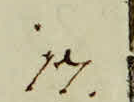17.
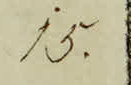15.
